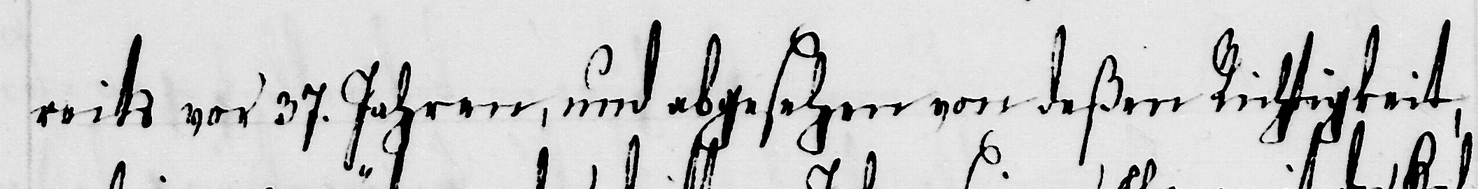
reits vor 37. Jahren, und abgesehen von deßen Richtigkeit,
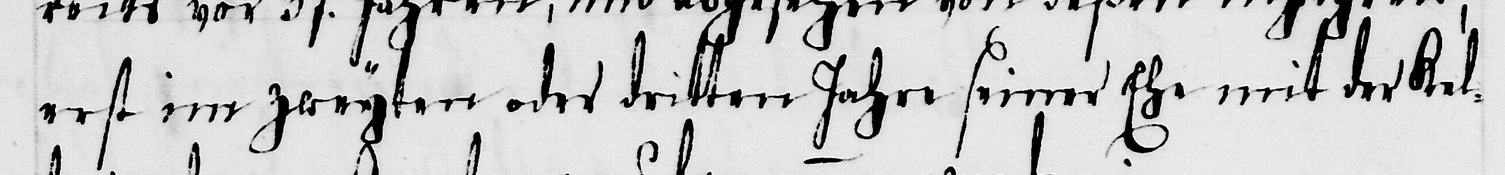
erst im zweyten oder dritten Jahre seiner Ehe mit der Kel¬
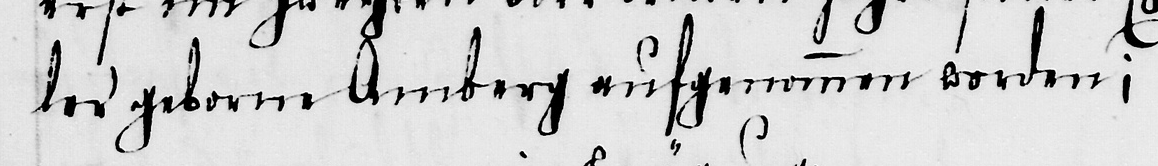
ler geborene Amberg aufgenommen worden;
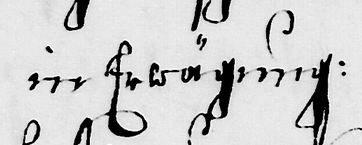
in Erwägung:
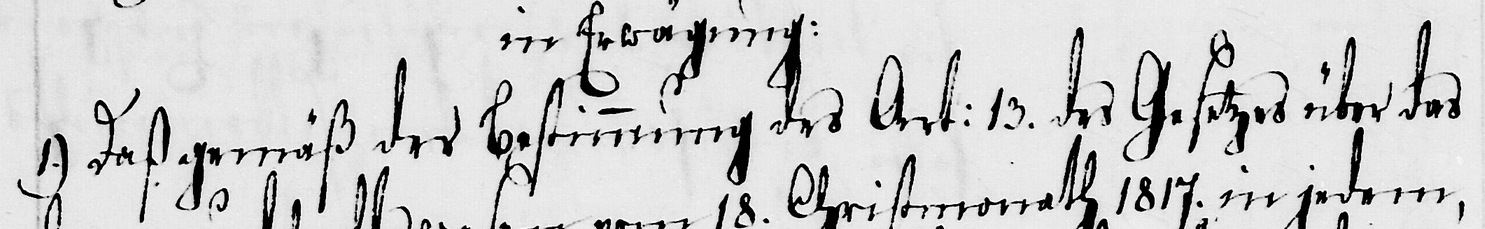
1.) Daß gemäß der Bestimmung des Art: 13. des Gesetzes über d¬
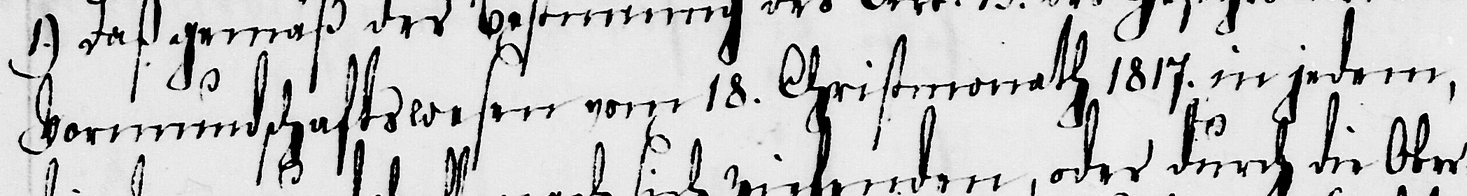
Vormundschaftswesen vom 18. Christmonath 1817. in jedem,
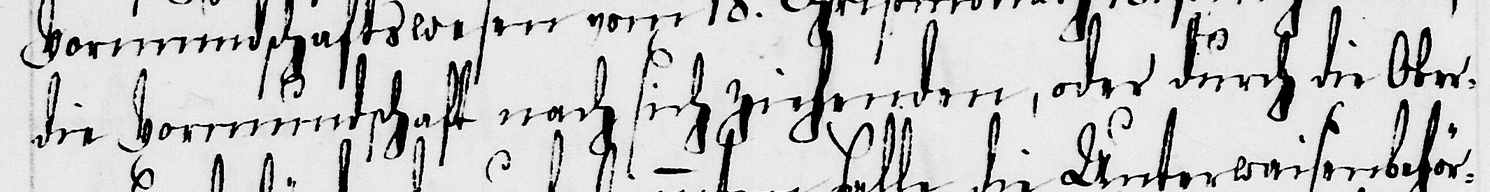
die Vormundschaft nach sich ziehenden, oder durch die Ober¬
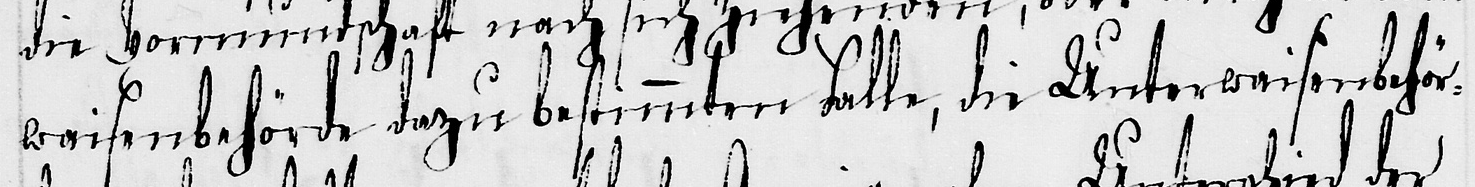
waisenbehörde dazu bestimmten Falle, die Unterwaisenbehö¬
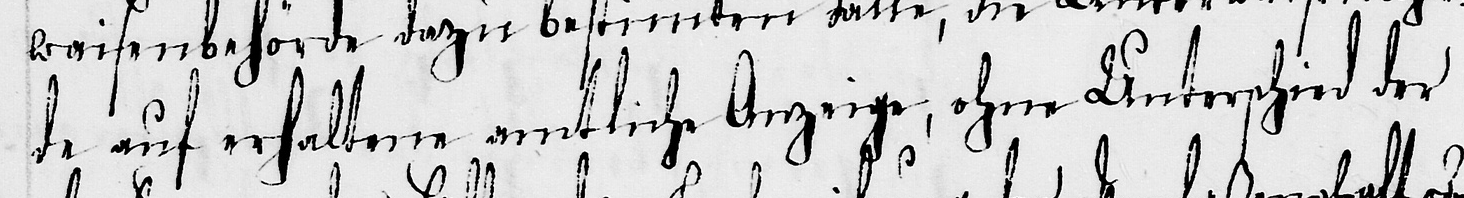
rde auf erhaltene amtliche Anzeige, ohne Unterschied der
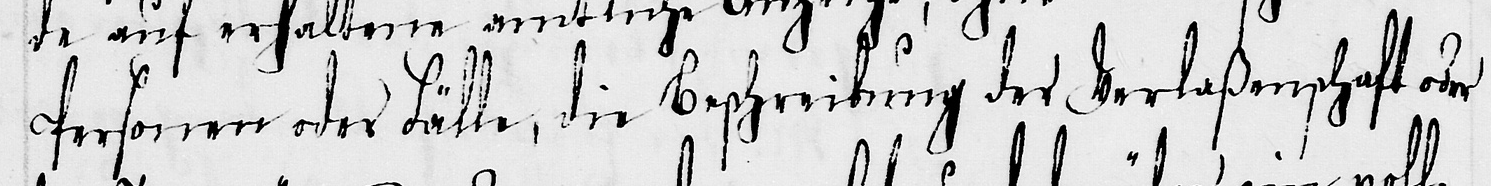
Personen oder Fälle, die Beschreibung der Verlaßenschaft od¬
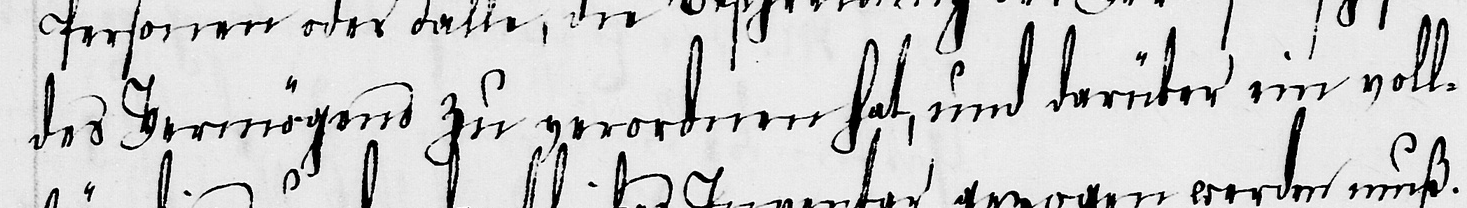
des Vermögens zu verordnen hat, und darüber ein voll¬
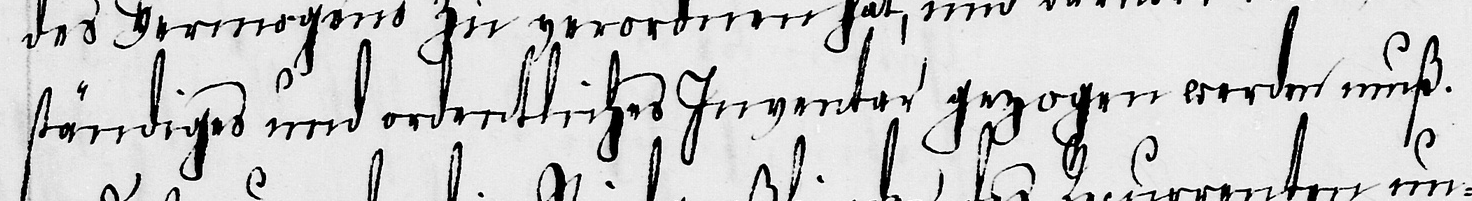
ständiges und ordentliches Inventar gezogen werden muß.
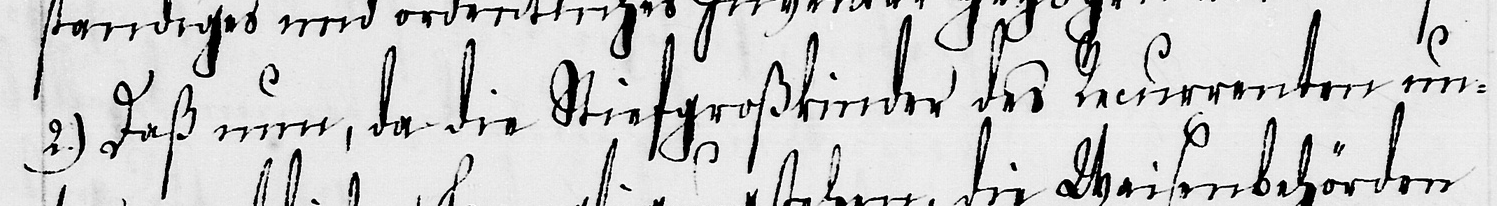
2.) Daß nun, da die Stiefgroßkinder des Recurrenten un¬
